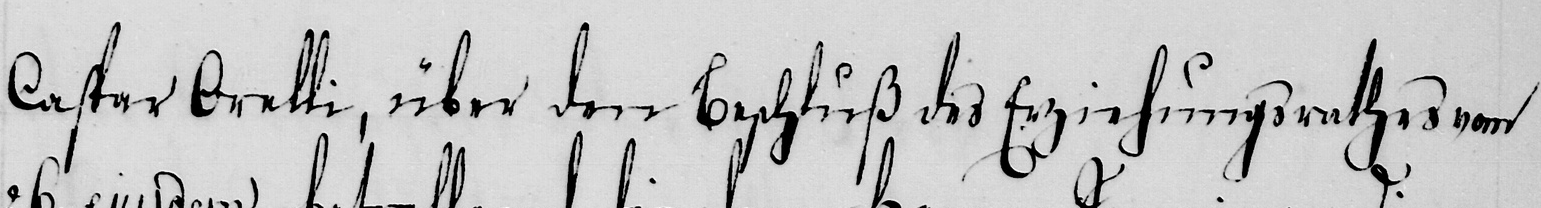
Caspar Orelli, über den Beschluß des Erziehungsrathes vom
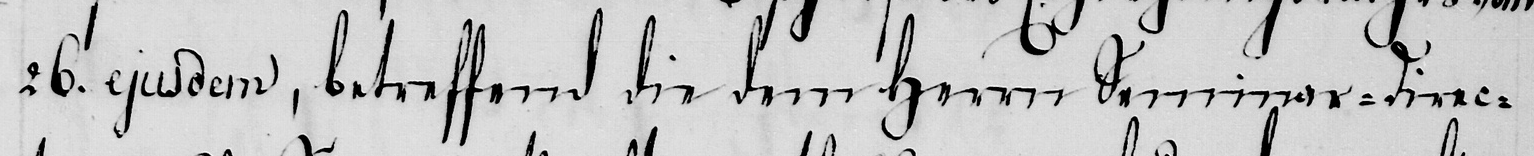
26. ejusdem, betreffend die dem Herrn Seminar-Direc¬
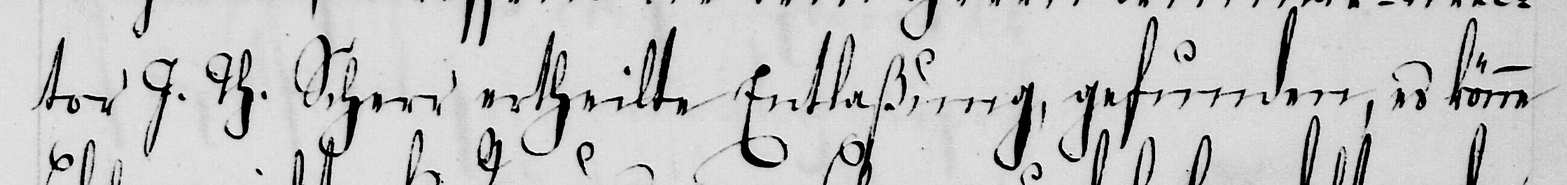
tor J. Th. Scherr ertheilte Entlaßung, gefunden, es könne
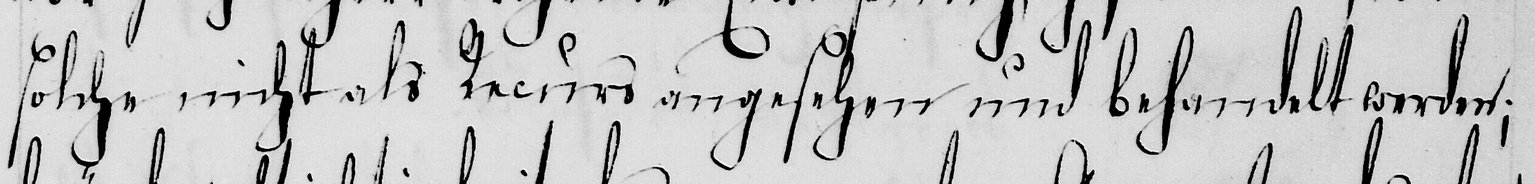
solche nicht als Recurs angesehen und behandelt werden;
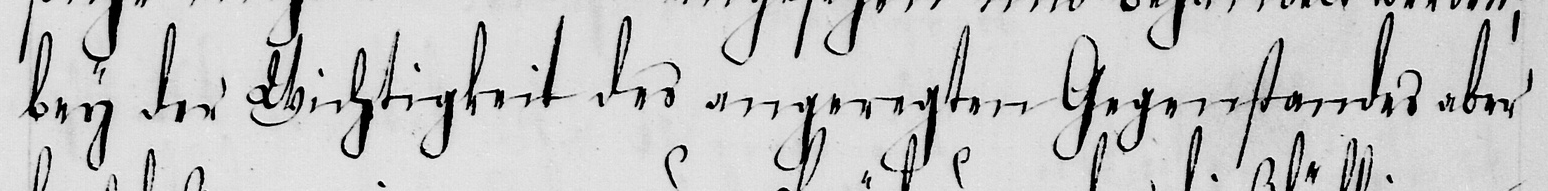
bey der Wichtigkeit des angeregten Gegenstandes aber
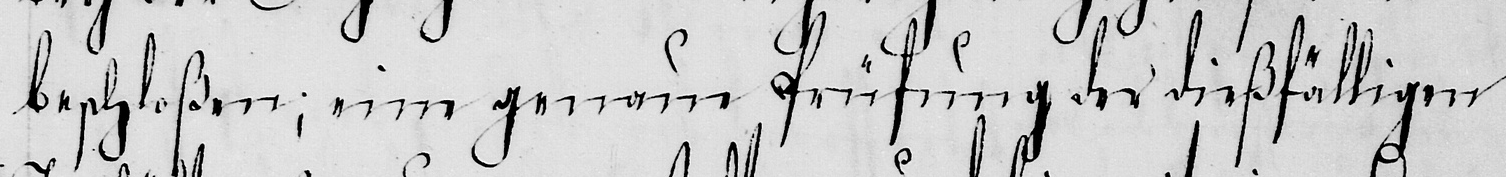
beschloßen; eine genaue Prüfung der dießfälligen
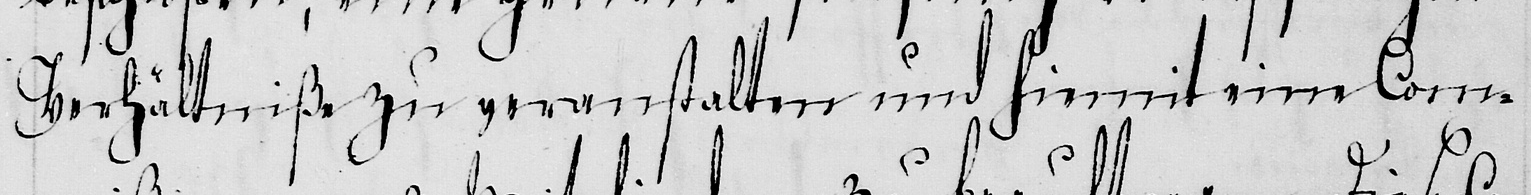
Verhältniße zu veranstalten und hiemit eine Com¬
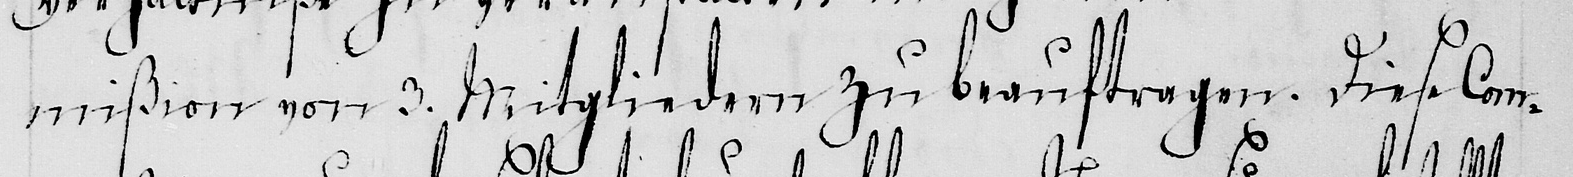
mißion von 3. Mitgliedern zu beauftragen. Diese Com¬
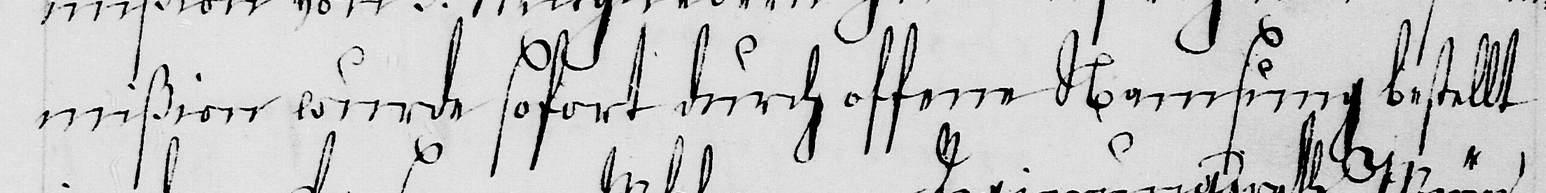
mißion wurde sofort durch offene Namsung bestellt
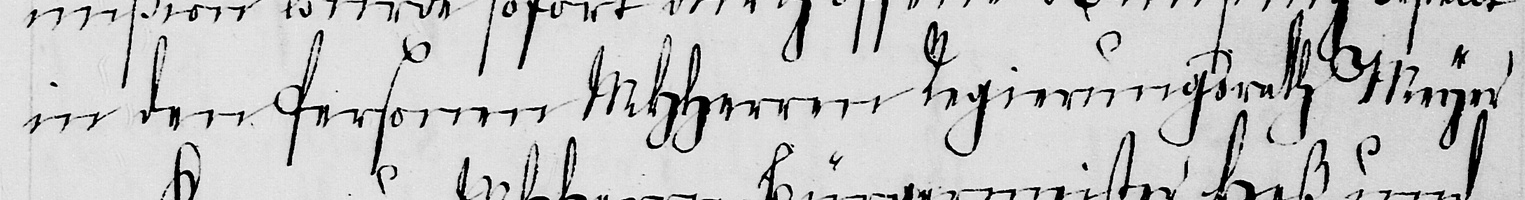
in den Personen MHHerren Regierungsrath Meyer
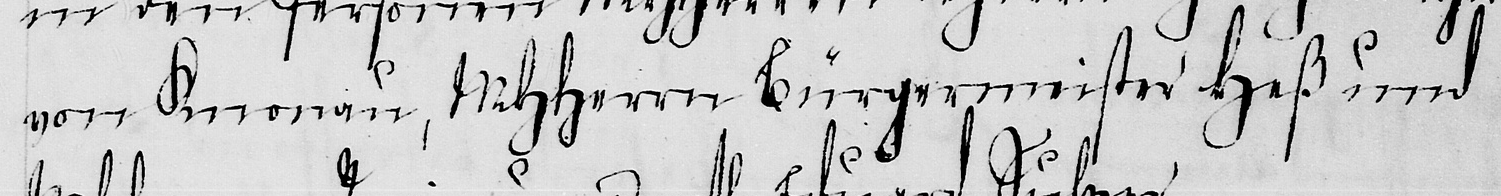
von Knonau, MHHerrn Bürgermeister Heß und
